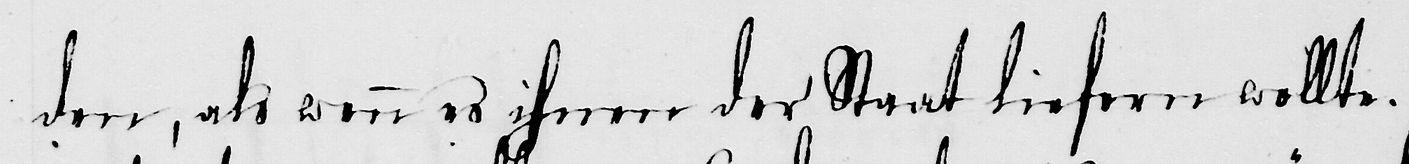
den, als wenn es ihnen der Staat liefern wollte.
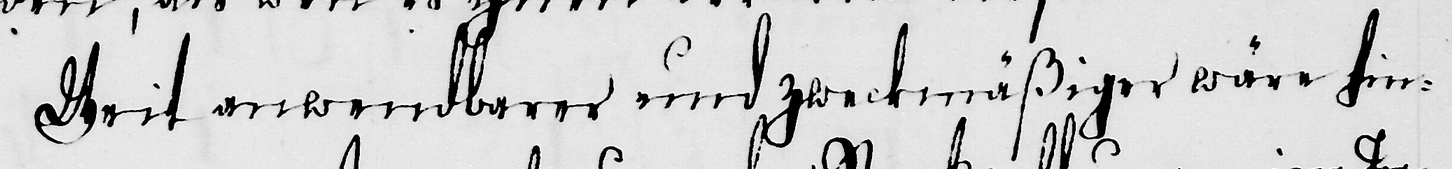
Weit anwendbarer und zweckmäßiger wäre hin¬
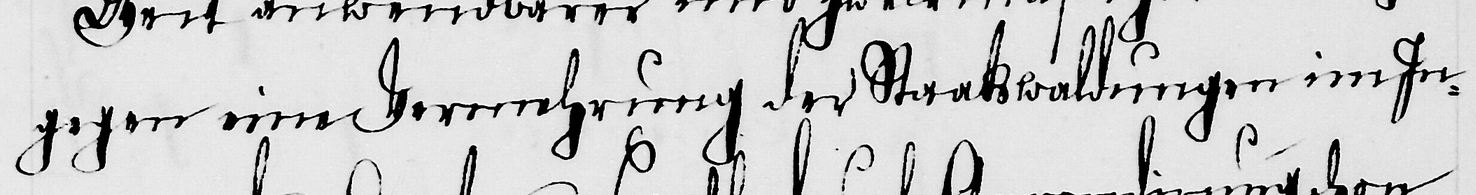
gegen eine Vermehrung der Staatswaldungen im In¬
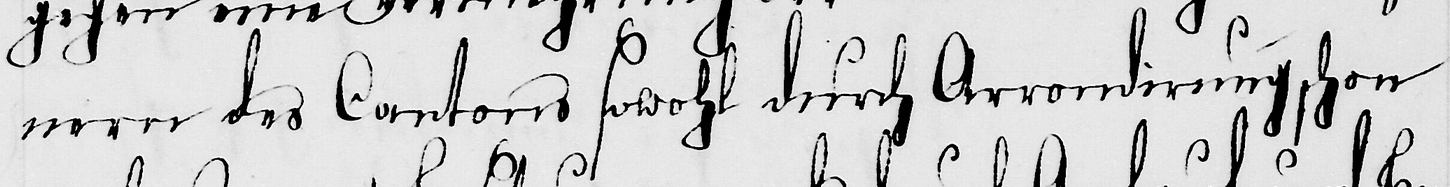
nern des Cantons sowohl durch Arrondierung schon
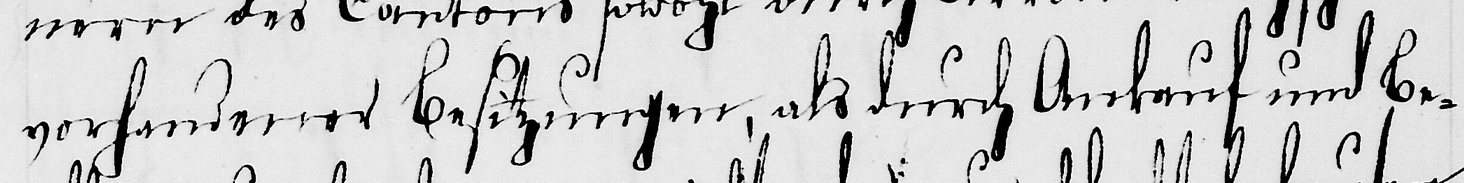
vorhandener Besitzungen, als durch Ankauf und Be¬
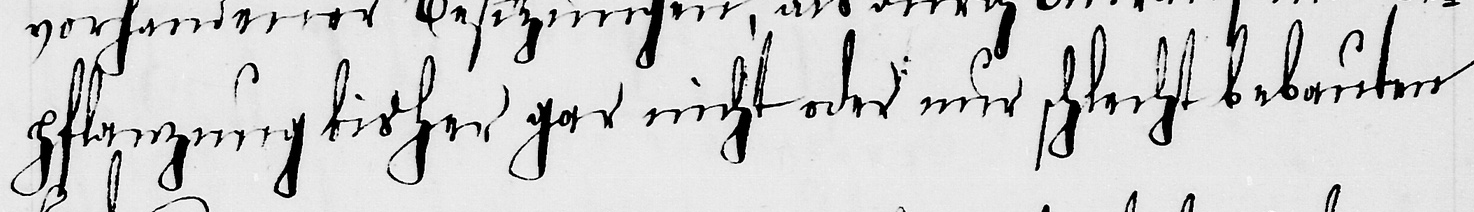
pflanzung bisher gar nicht oder nur schlecht bebauten
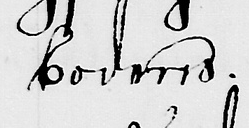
Bodens.
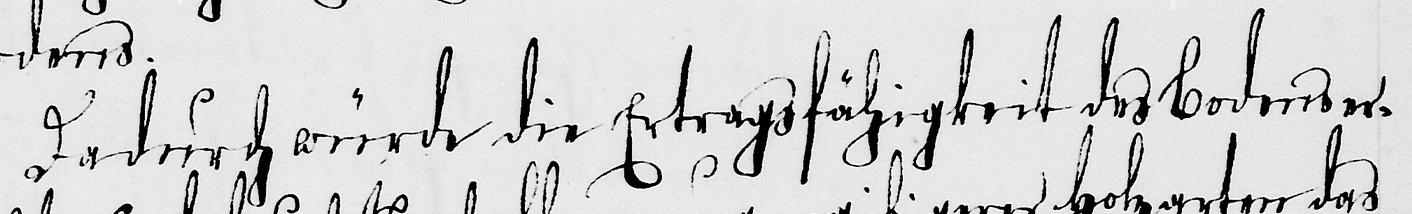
Dadurch würde die Ertragsfähigkeit des Bodens er¬
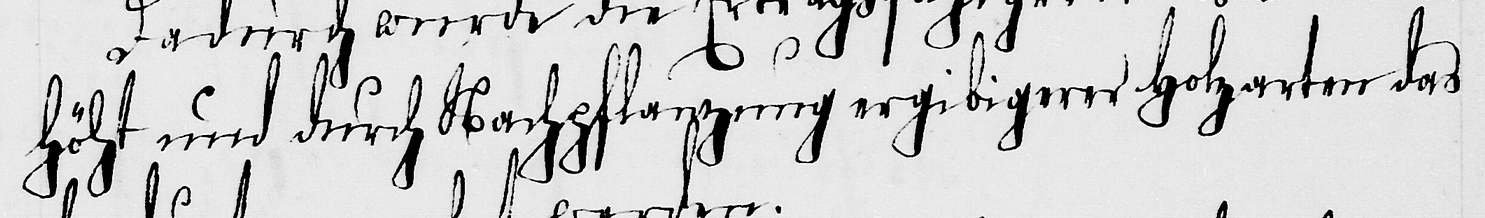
höht und durch Nachpflanzungen ergiebigerer Holzarten das
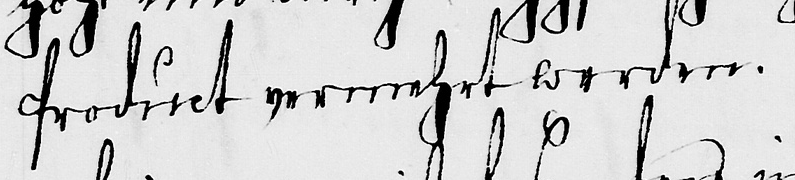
Product vermehrt werden.
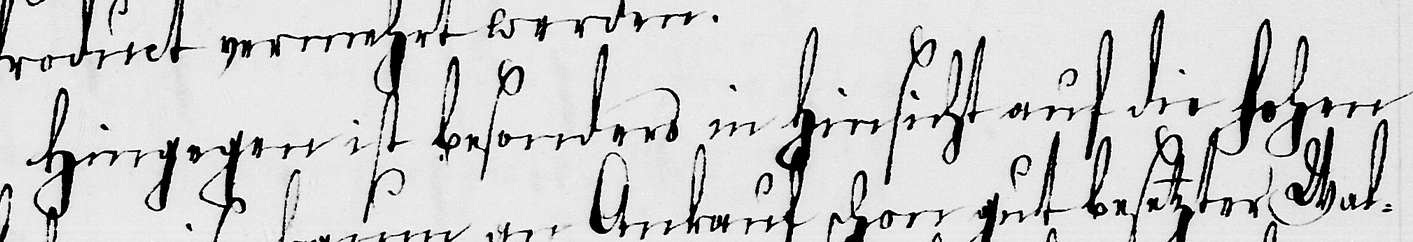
Hingegen ist besonders in Hinsicht auf die Hohen
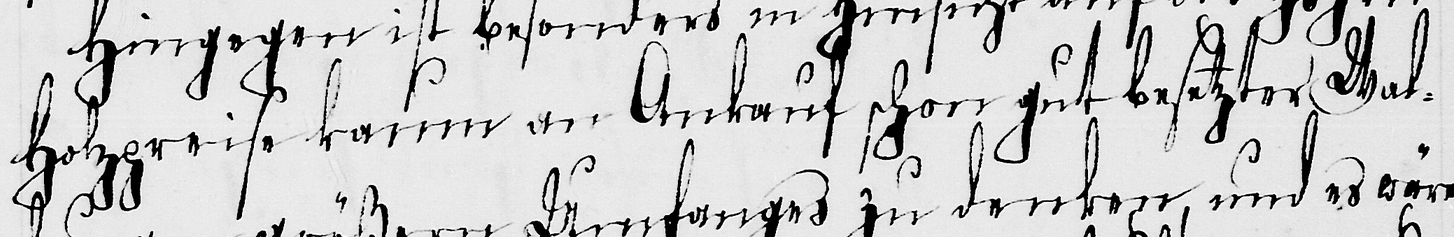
Holzpreise kaum an Ankauf schon gut besetzter Wal¬
